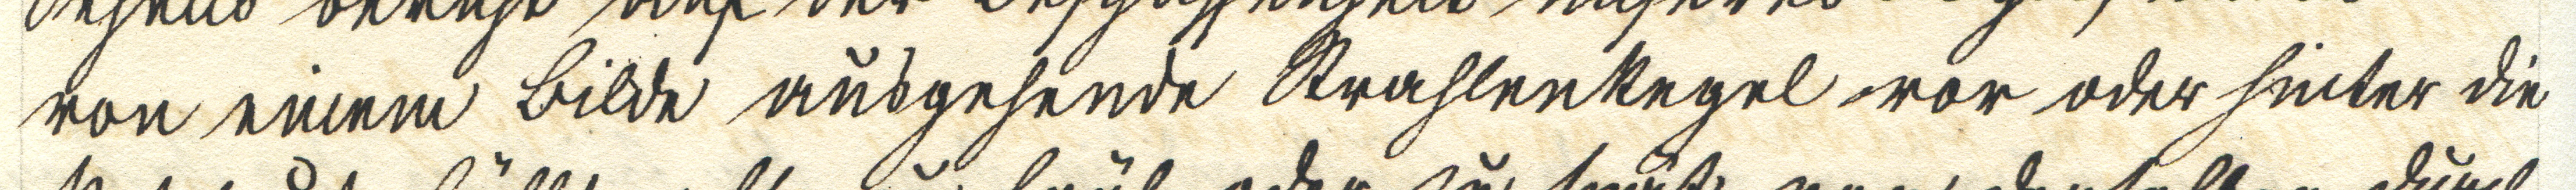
von einem Bilde ausgehende Strahlenkegel vor oder hinter die
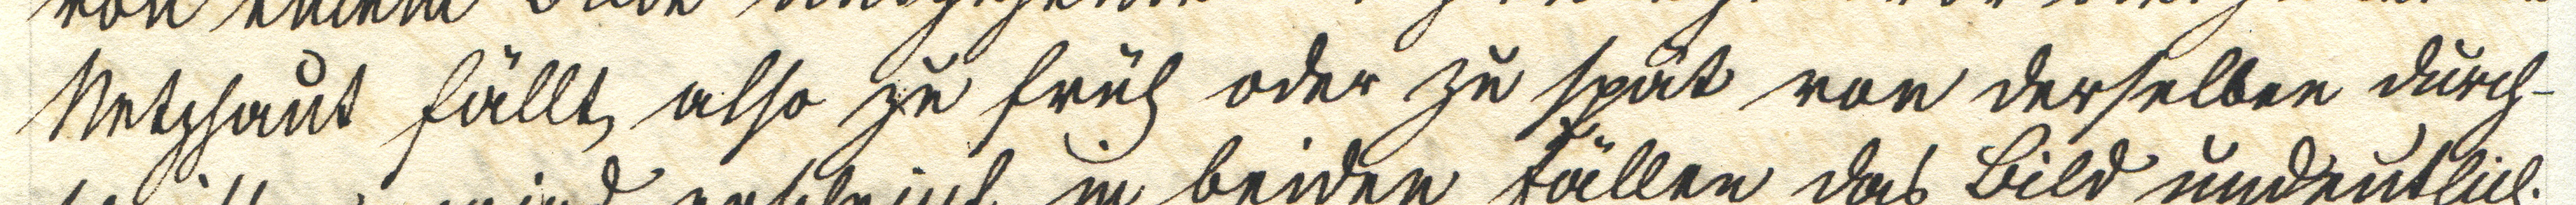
Netzhaut fällt, also zu früh oder zu spät von derselben durch-
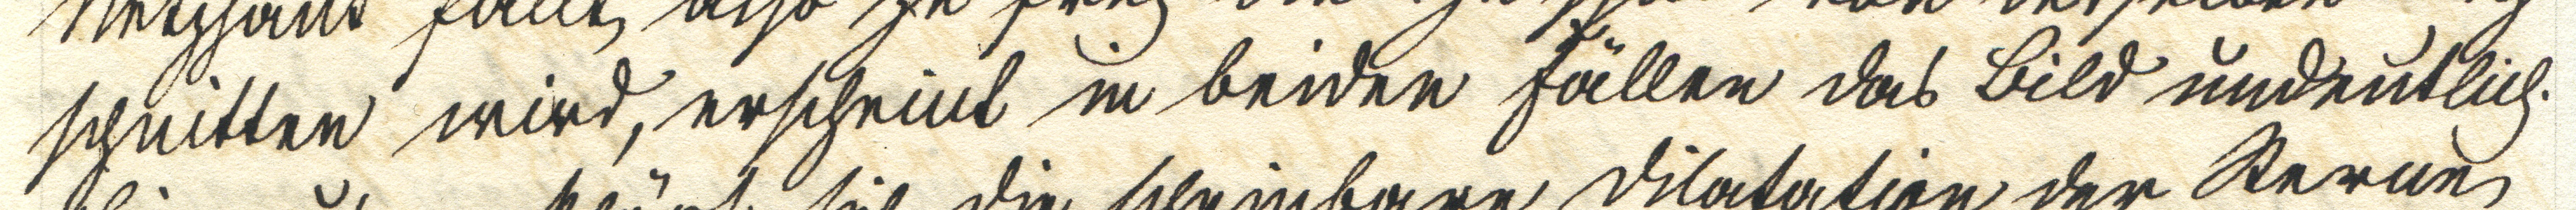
schnitten wird, erscheint in beiden Fällen das Bild undeutlich.
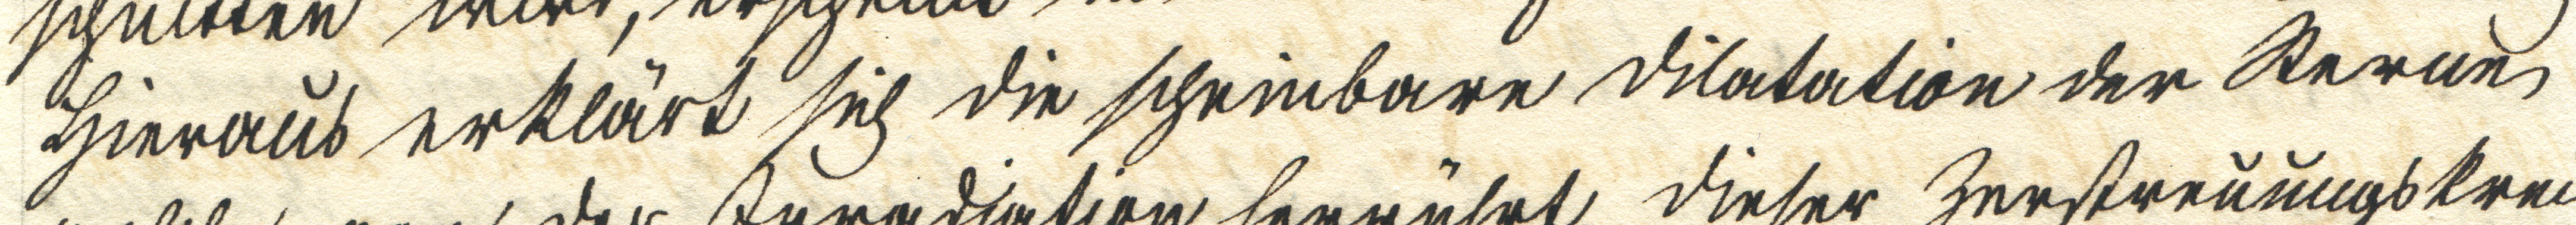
Hieraus erklärt sich die scheinbare Dilatation der Sterne,
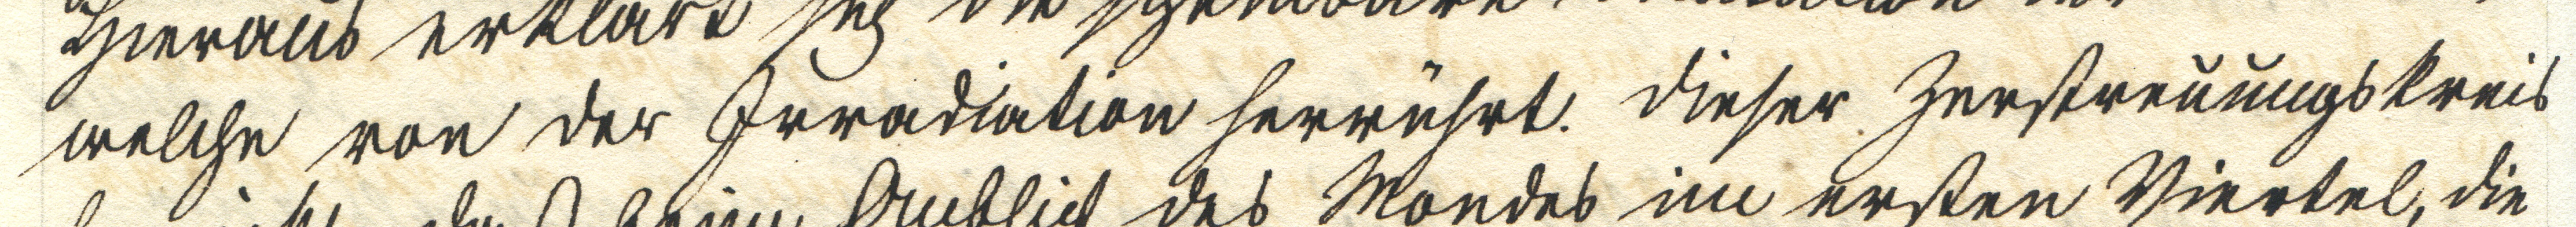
welche von der Irradiation herrührt. Dieser Zerstreuungskreis
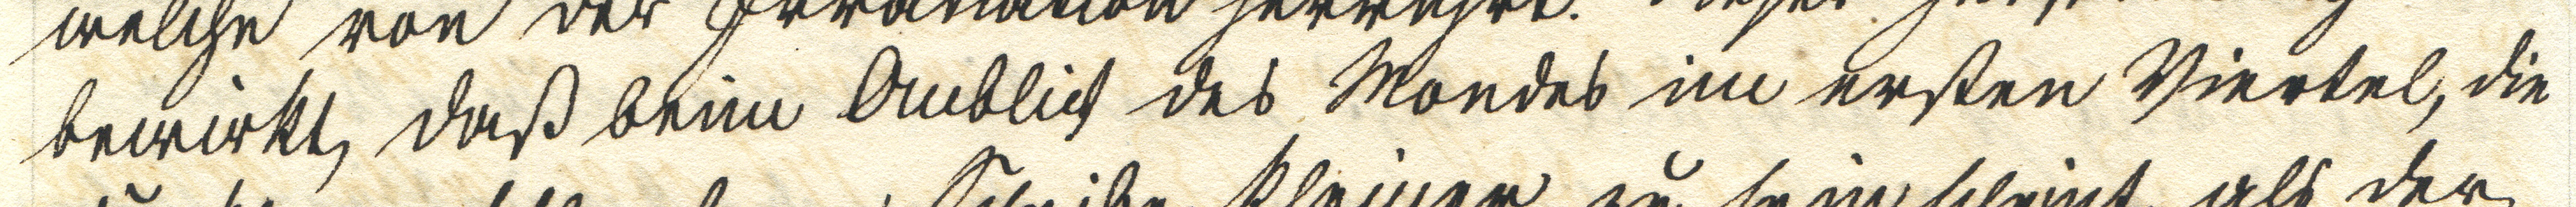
bewirkt, daß beim Anblick des Mondes im ersten Viertel, die
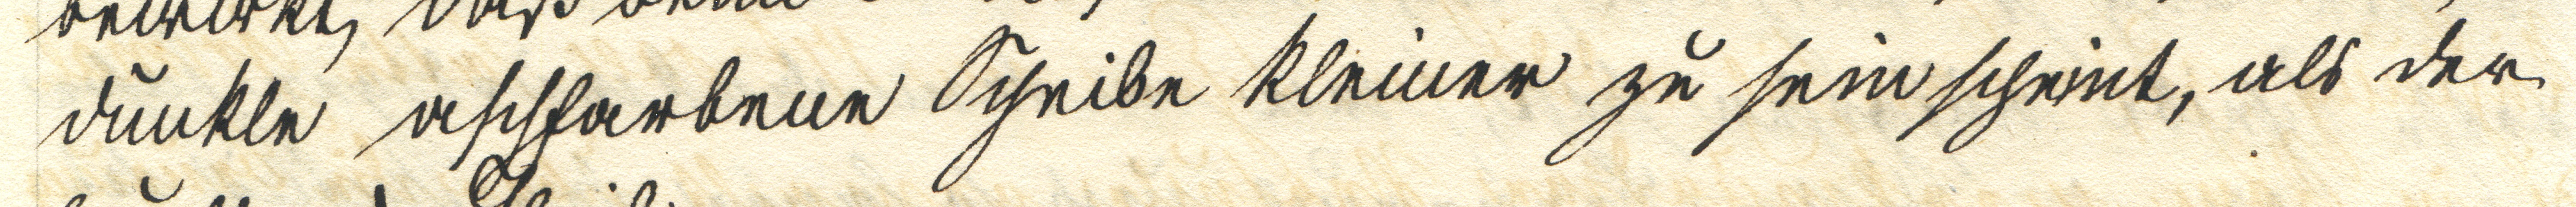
dunkle aschfarbene Scheibe kleiner zu sein scheint, als der
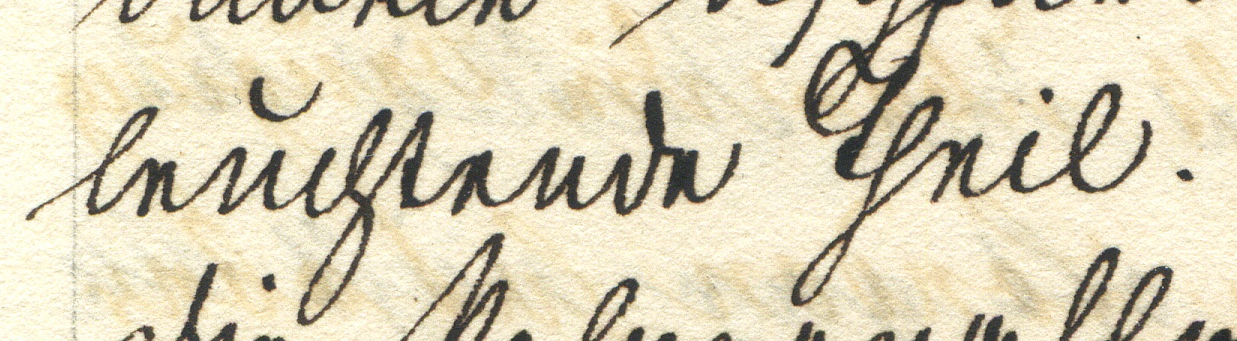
leuchtende Theil.
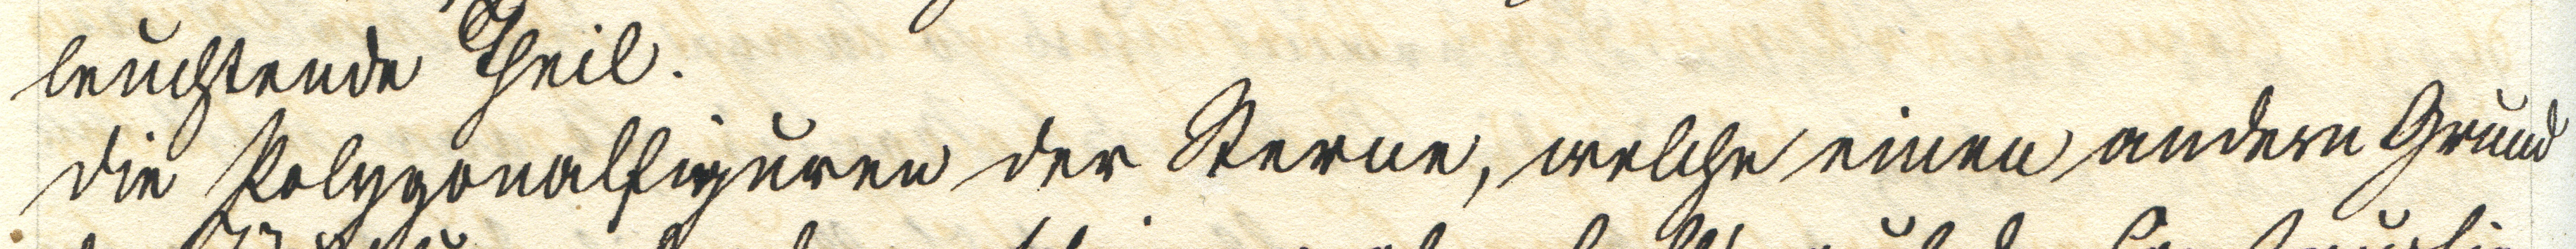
Die Polygonalfiguren der Sterne, welche einen andern Grund
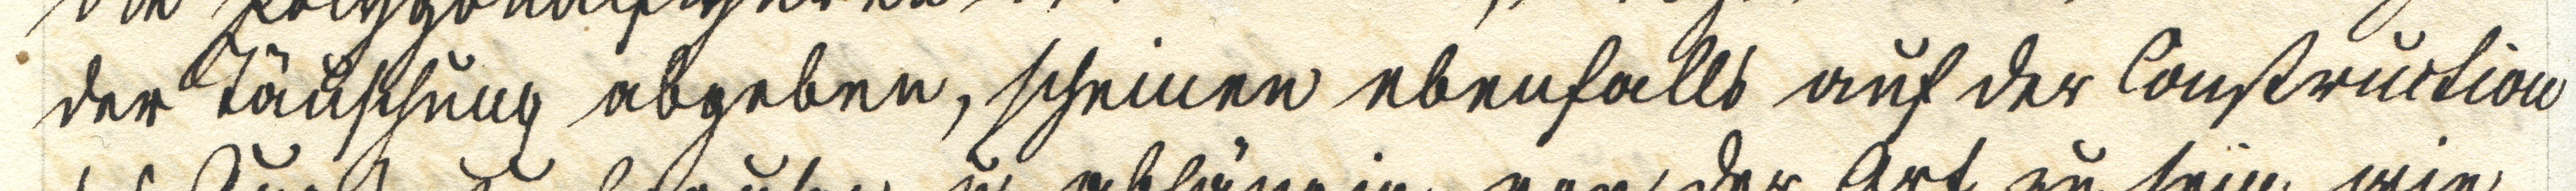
der Täuschung abgeben, scheinen ebenfalls auf der Construction
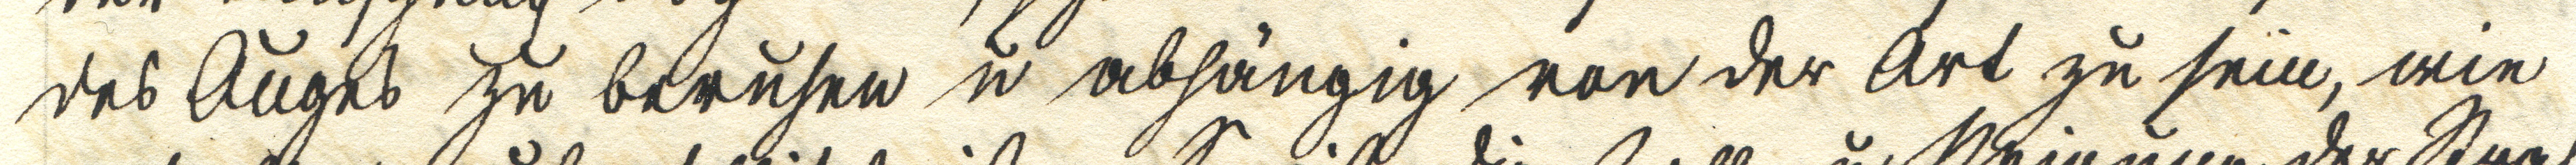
des Auges zu beruhen u abhängig von der Art zu sein, wie
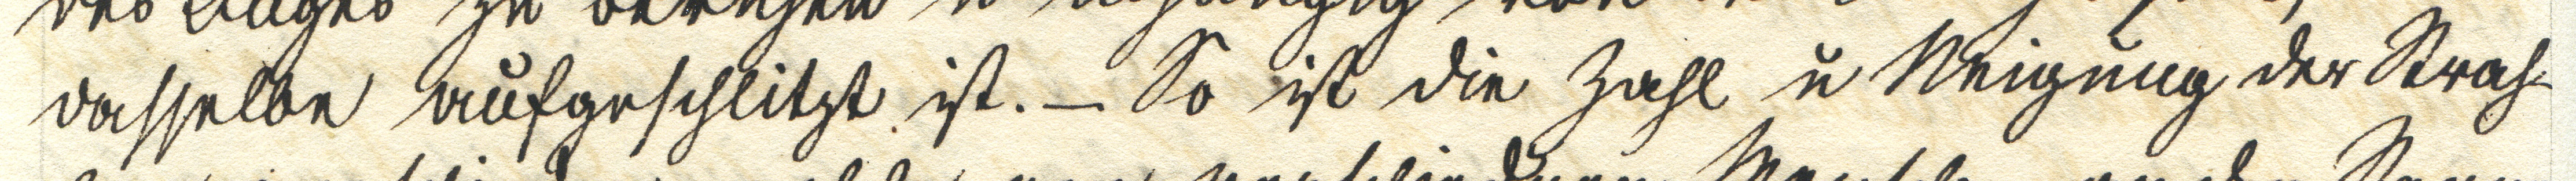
dasselbe aufgeschlitzt ist. – So ist die Zahl u Neigung der Strah-
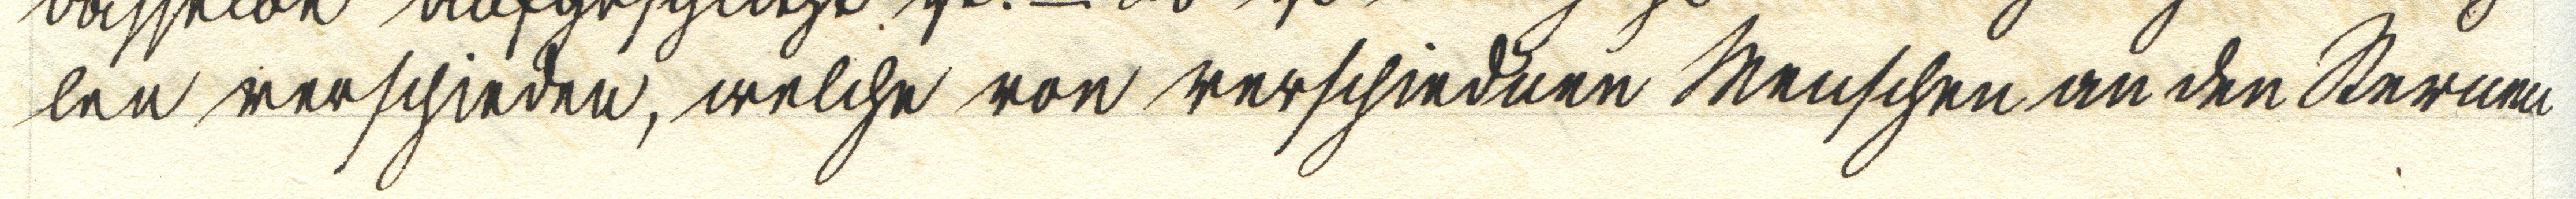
len verschieden, welche von verschiednen Menschen an den Sternen
